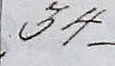34
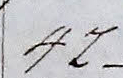42
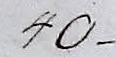40
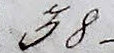38
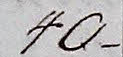40
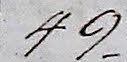49
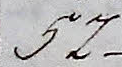52
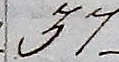37
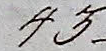43
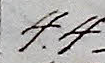44
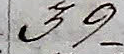39
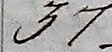37
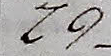29
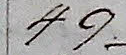49
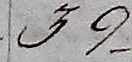39
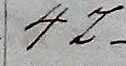42
